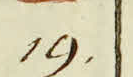19.
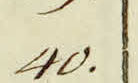40.
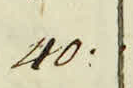40.
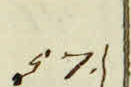57.
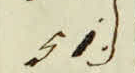51.
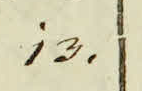13.
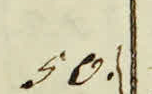50.
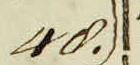48.
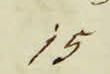15
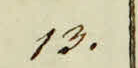13.
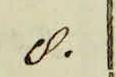8.
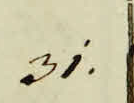31.
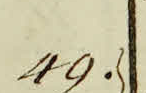49.
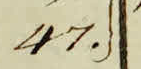47.
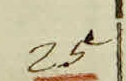25
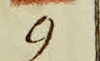9
